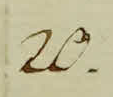20
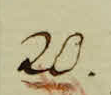20
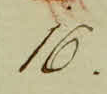16
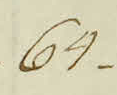64
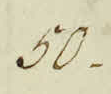50
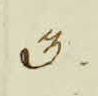3
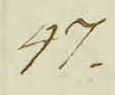47
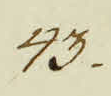43
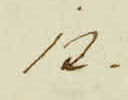12
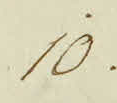10
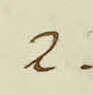2
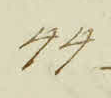44
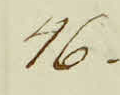46
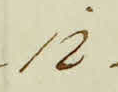12
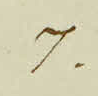7
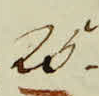25
